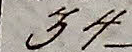34
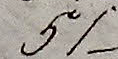51
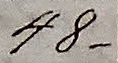48
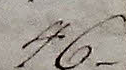46
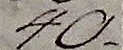40
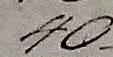40
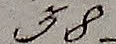38
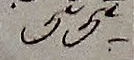55
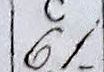61
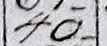40
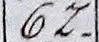62
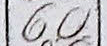60
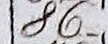86
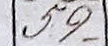59
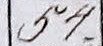54
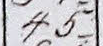45
